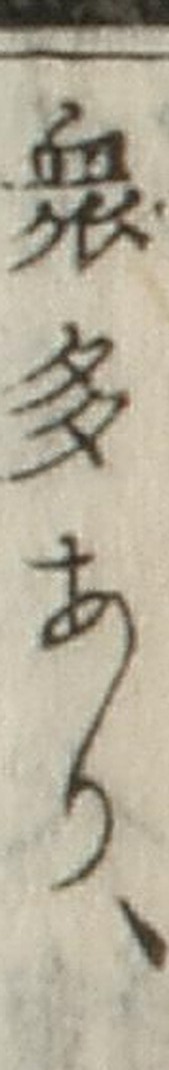衆多あり、
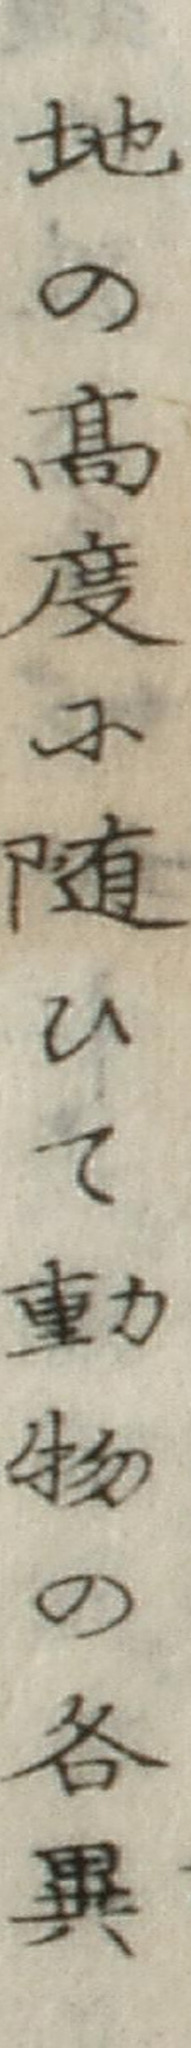地の高度に随ひて動物の各異
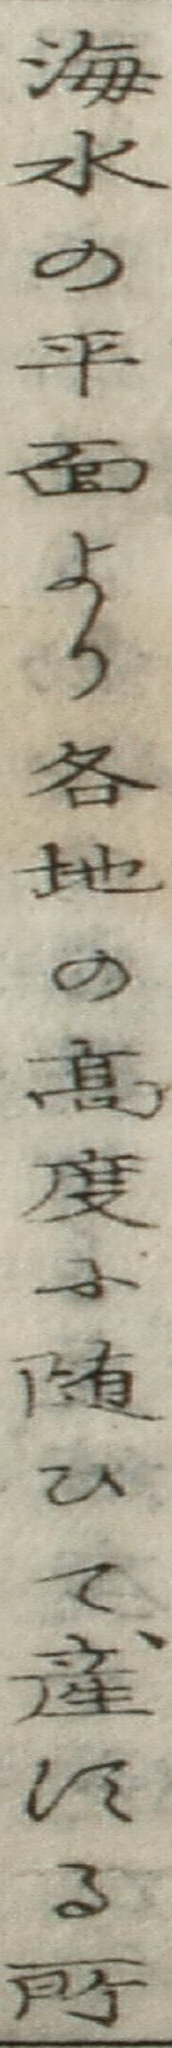海水の平面より各地の高度に随ひて、産する所
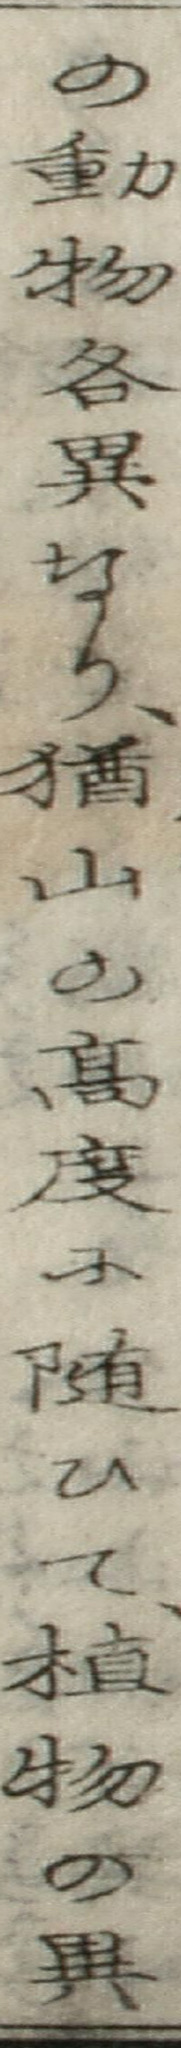の動物各異なり、猶山の高度に随ひて、植物の異

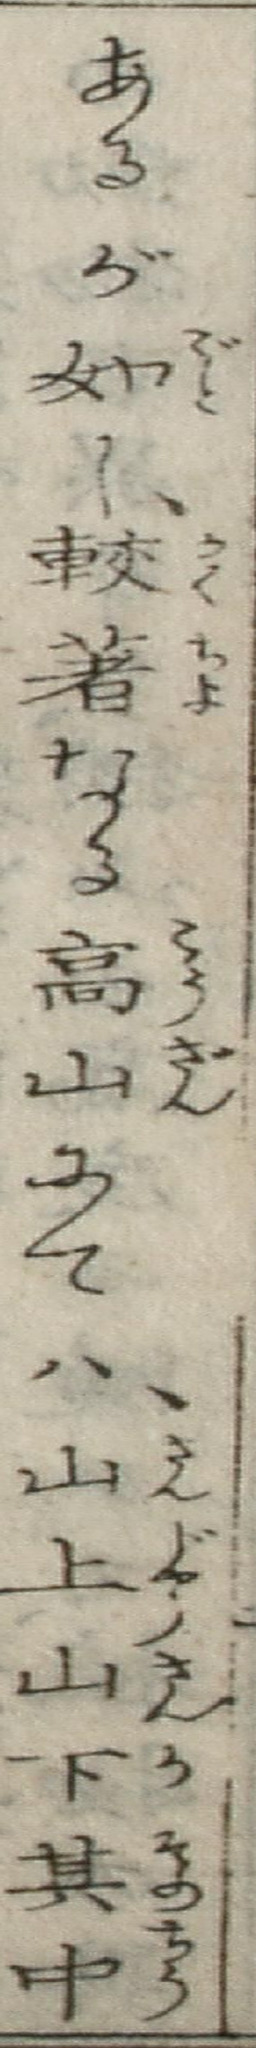あるが如し、較著なる高山にては、山上山下其中
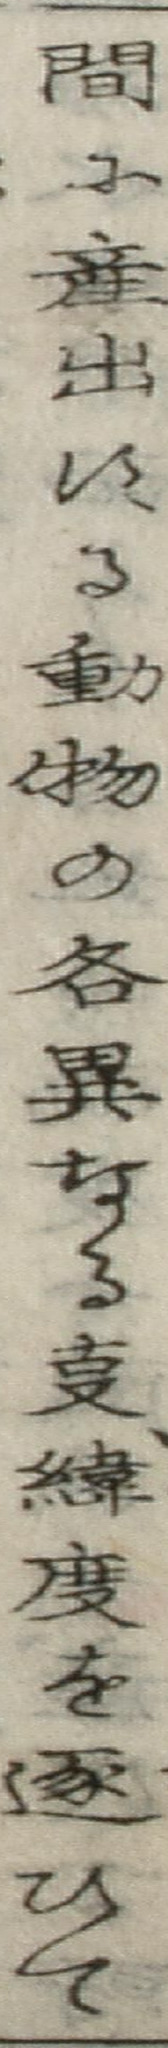間に産出する動物の各異なる事、緯度を遂ひて
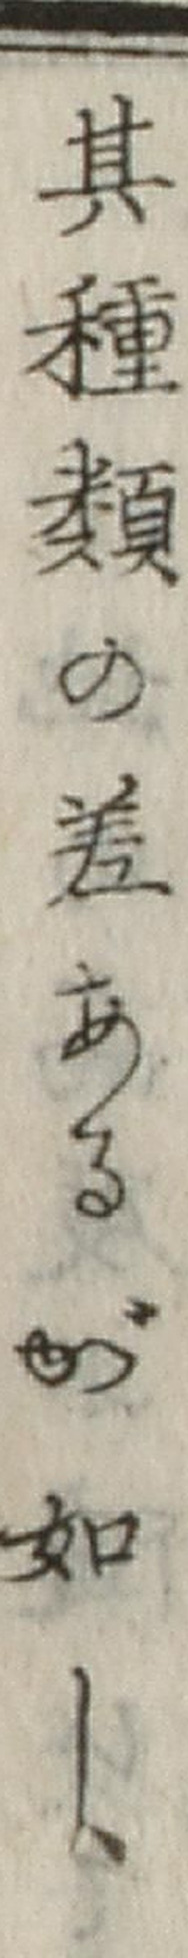其種類の差あるが如し、
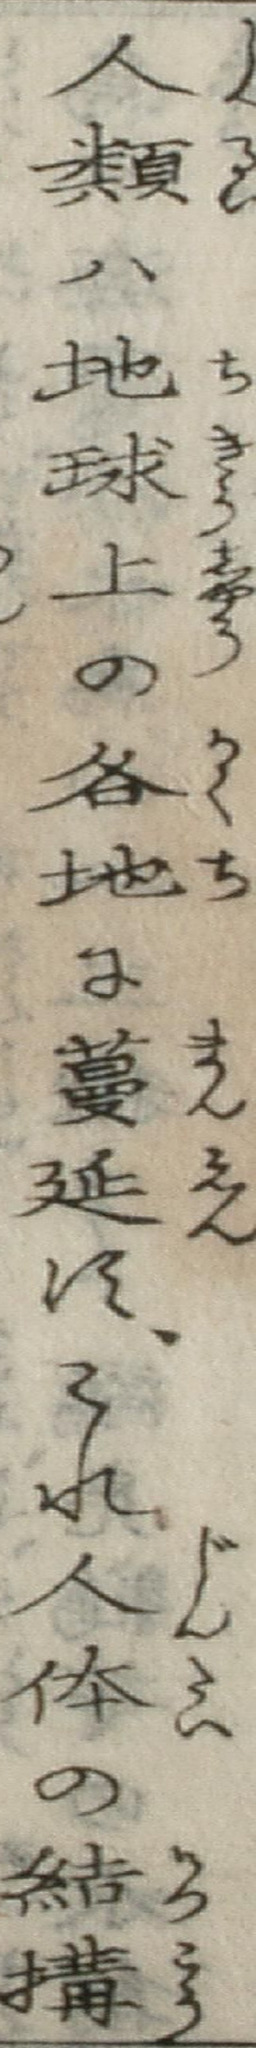人類は地球上の各地に蔓延す、これ人体の結構
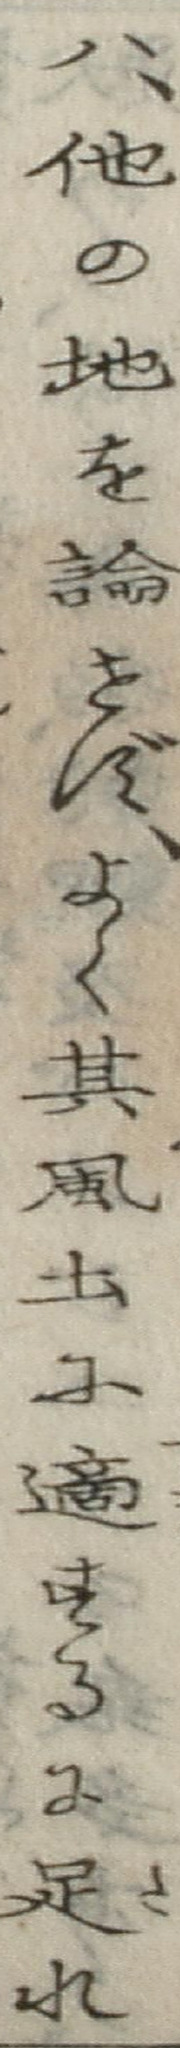は、他の地を論せず、よく其風土に適するに足れ
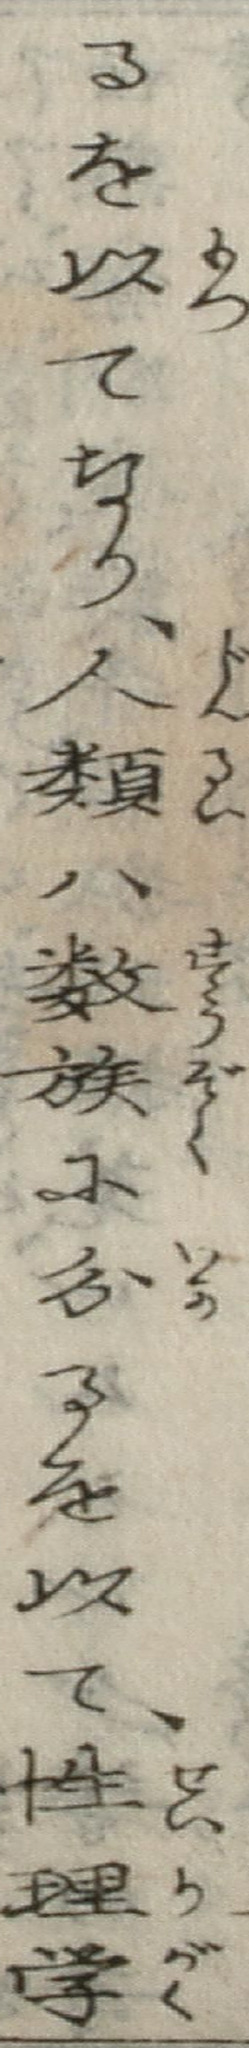るを以てなり、人類は数族に分るを以て、性理学
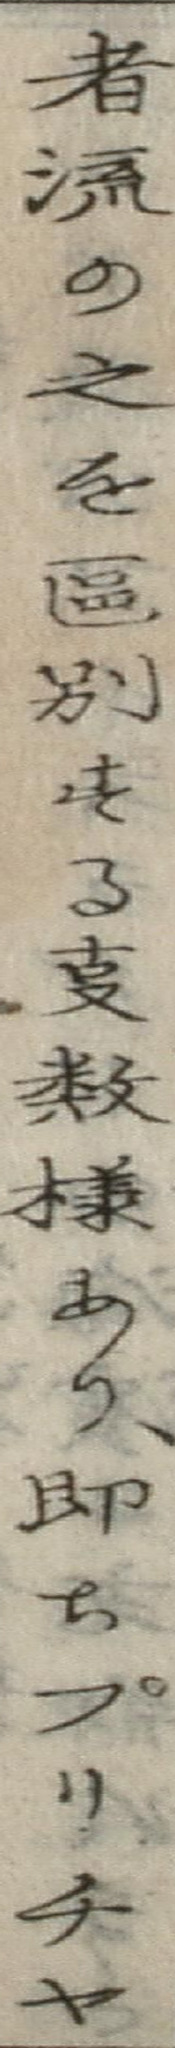者流の之を区別する事数様あり、即ちプリチヤ
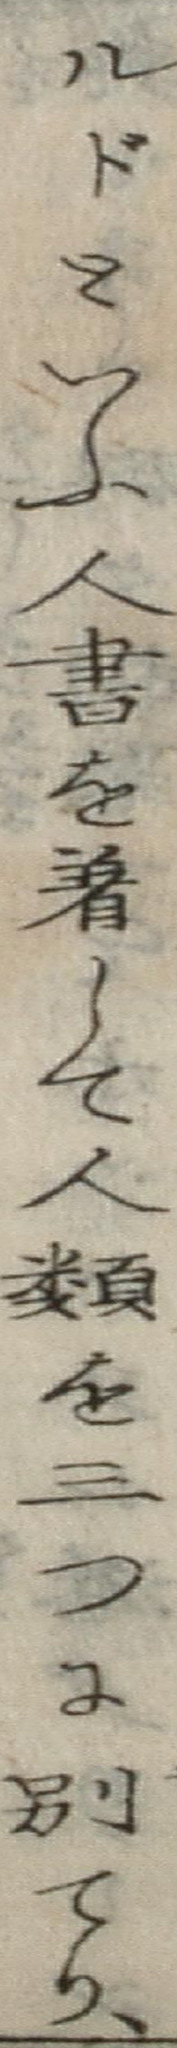ルドといふ人書を著して人類を三つに別てり、
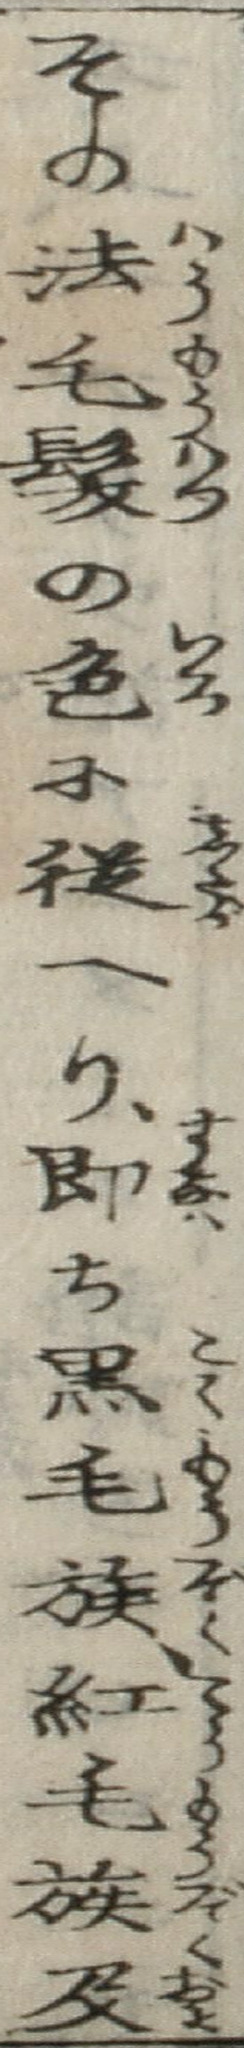その法毛髪の色に従へり、即ち黒毛族、紅毛族及
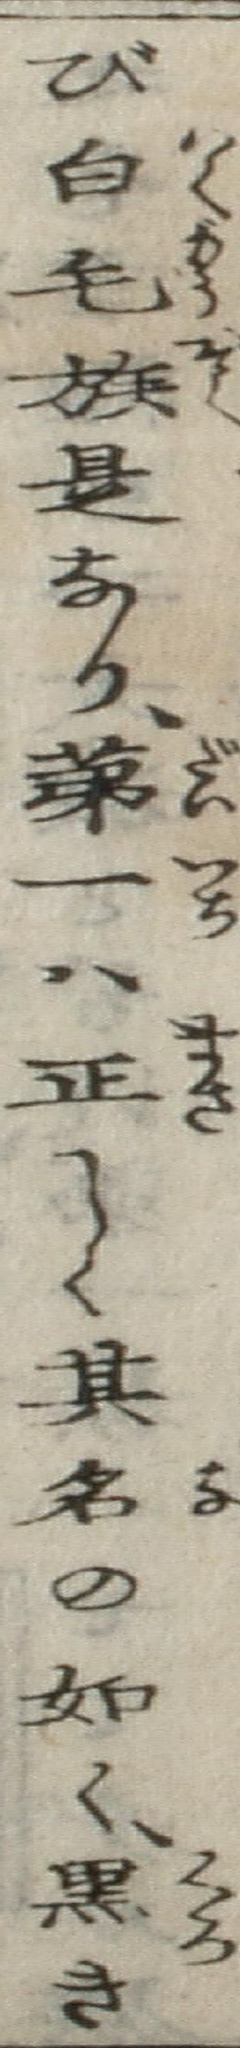び白毛族是なり、第一は、正しく其名の如く、黒き
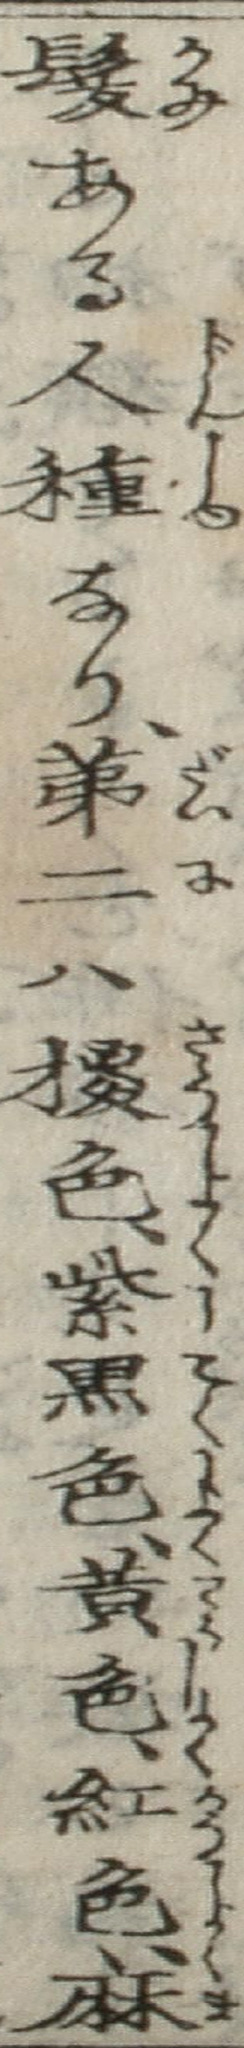髪ある人種なり、第二は棕色、紫黒色、黄色、紅色、麻
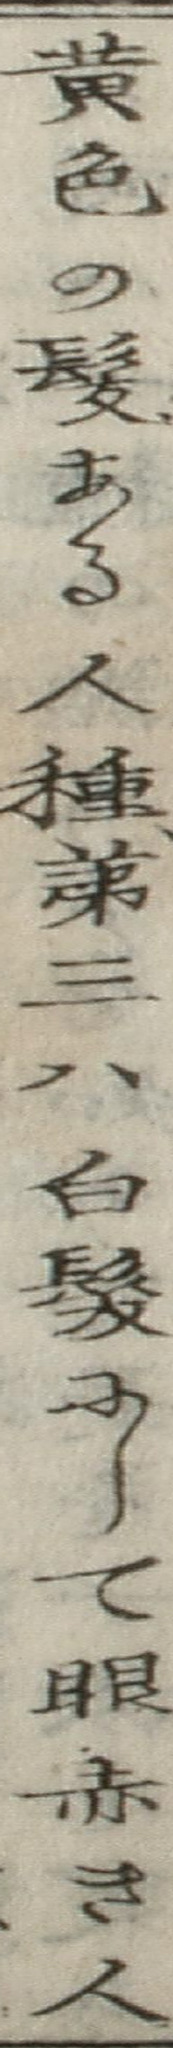黄色の髪ある人種、第三は白髪にして眼赤き人
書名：訓蒙　天然地理學　下
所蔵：東京大学地震研究所図書室 Earthquake Research Institute Library, The University of Tokyo, JAPAN
